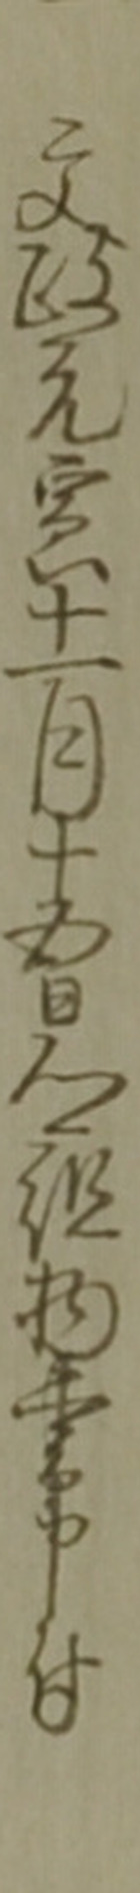一文政元寅十一月十五日郷組物書申付
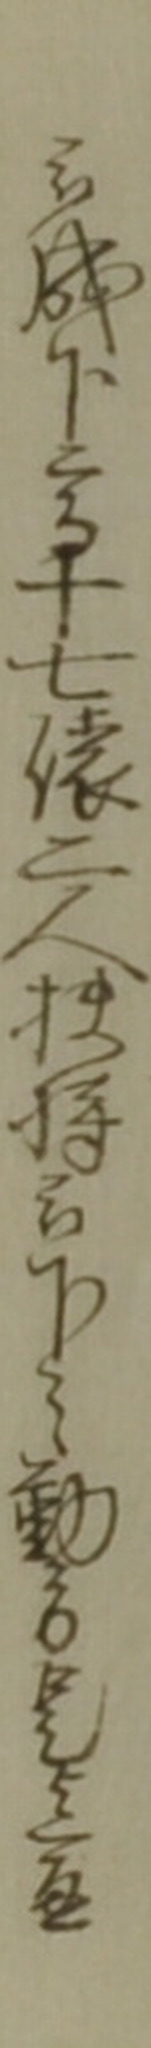被成下高十七俵二人扶持被下之勤方是迄通
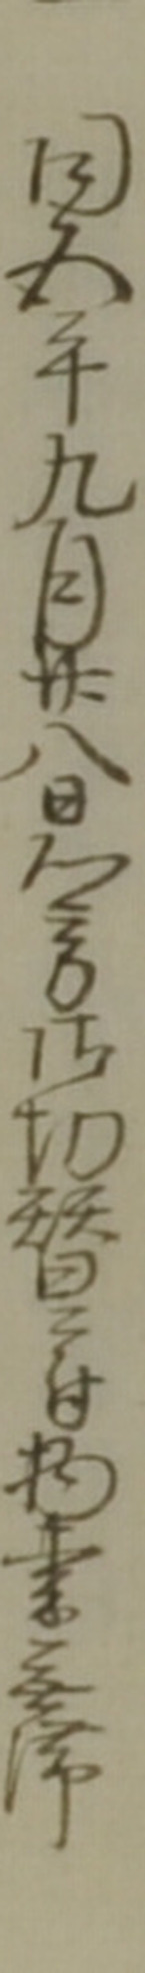一同五午九月廿八日郷方御切替ニ付物書無滞
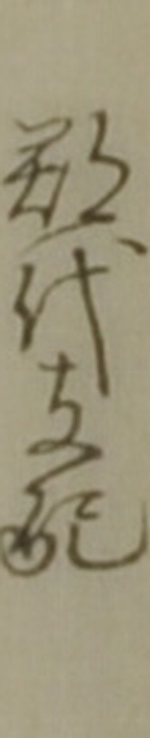郡代支配
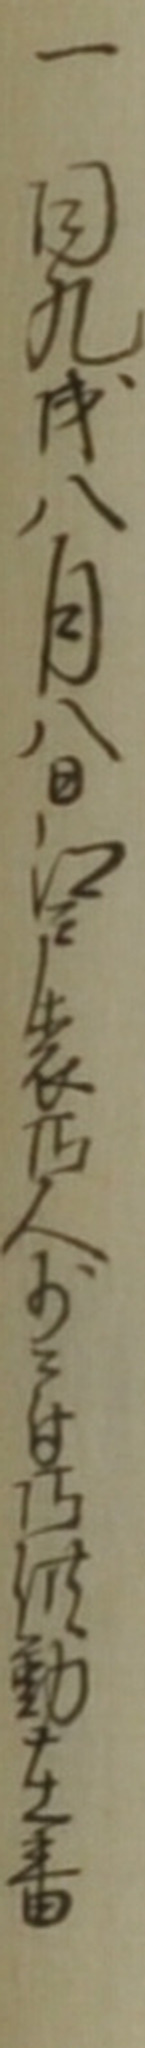一同九戌八月八日江戸表御人少ニ付御供勤在番
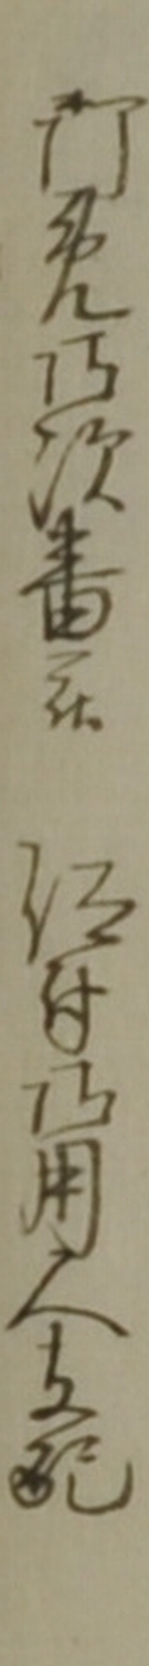御免御次番被仰付御用人支配
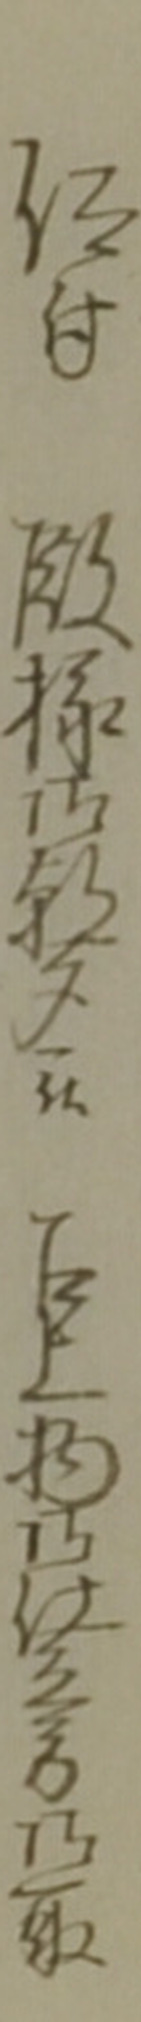仰付殿様御朝夕被召上物御仕立方御取
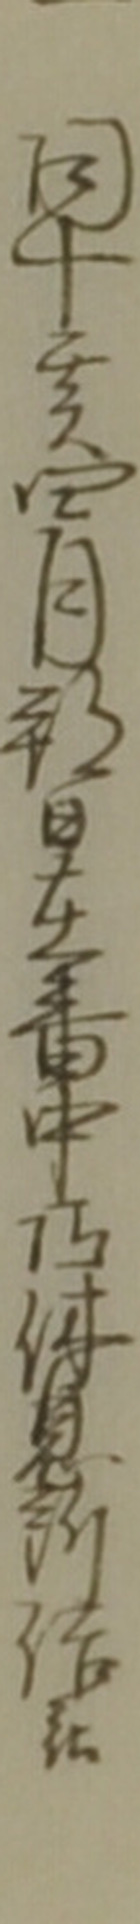一同十亥四月朔日在番中御休息所詰被
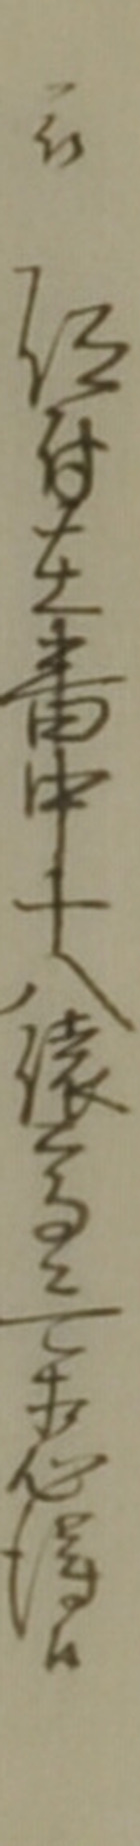被仰付在番中十八俵高ニ可相心得候
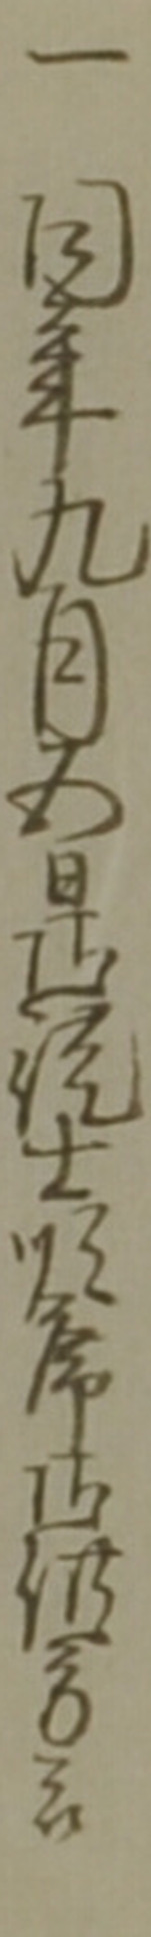一同年九月五日御徒士順席御供方被
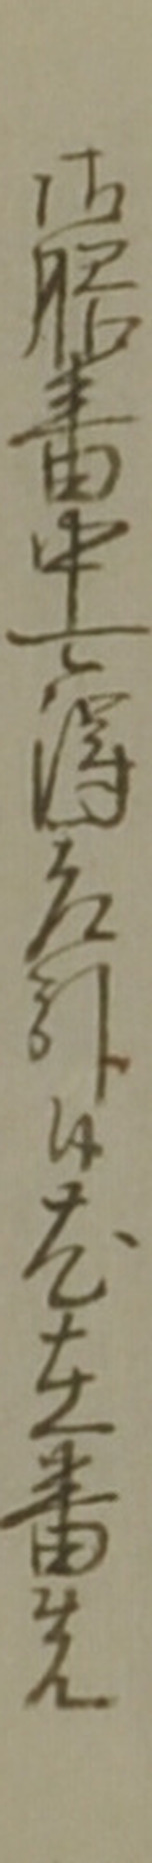御膳番中可得◻︎引候尤在番先
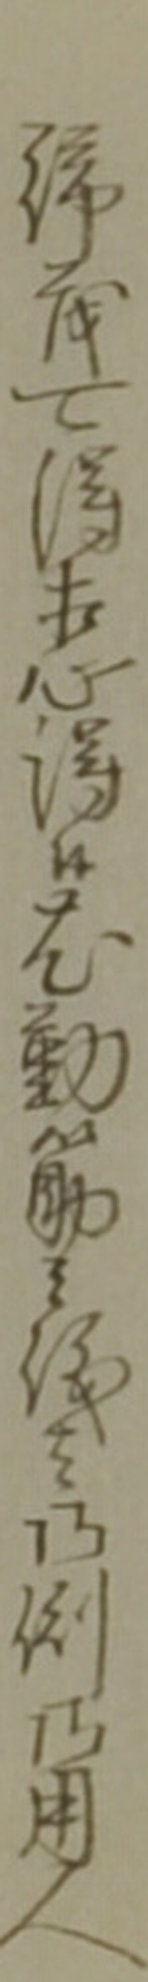◻︎茂可得相心得候尤勤筋之儀は御例御用人
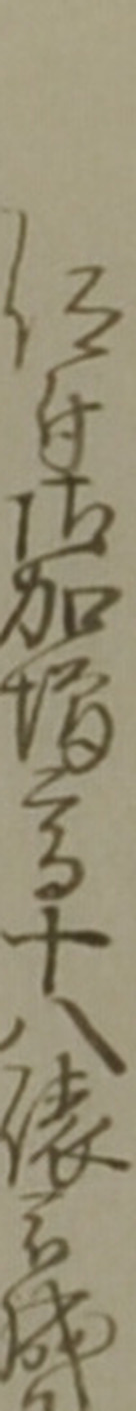仰付御加増高十八俵被成下
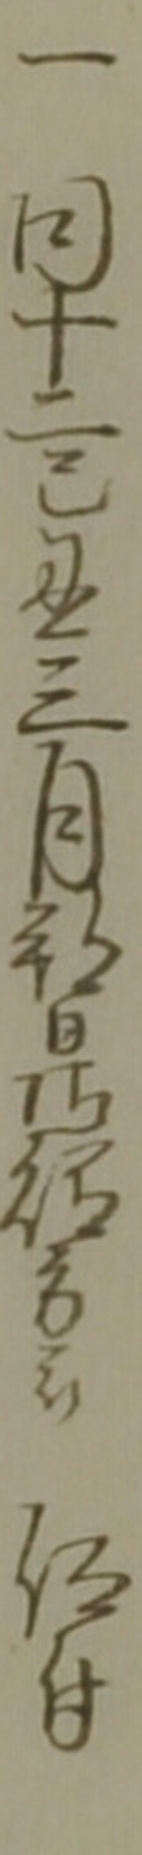一同十二己丑三月朔日御賄方被仰付
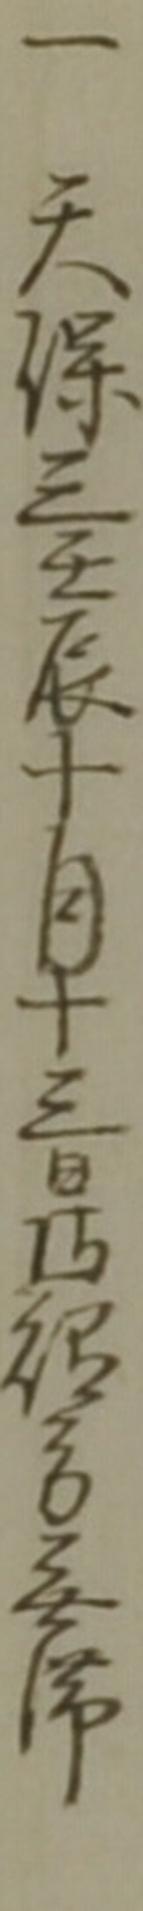一天保三壬辰十月十三日御賄方無滞
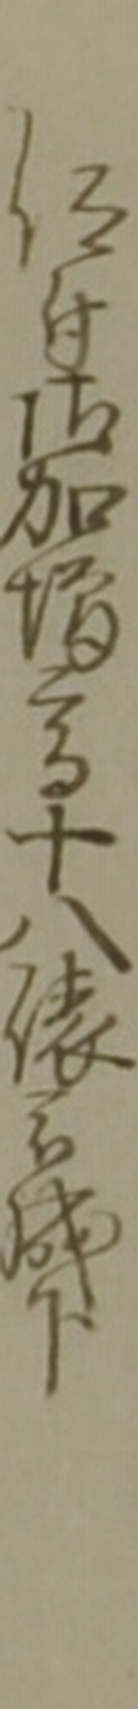仰付御加増高十八俵被成下
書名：無足諸士勤仕録（七）
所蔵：伊那市立高遠町図書館・合同会社AMANE
